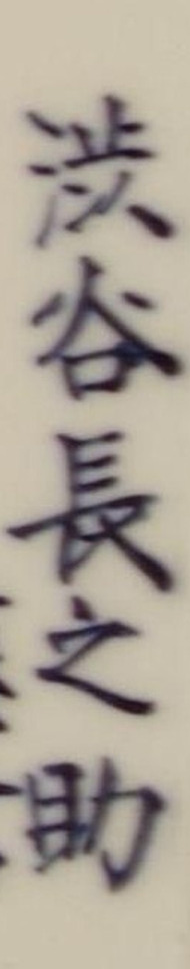渋谷長之助
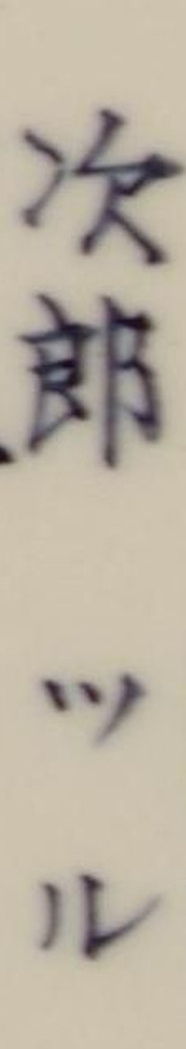次郎ツル
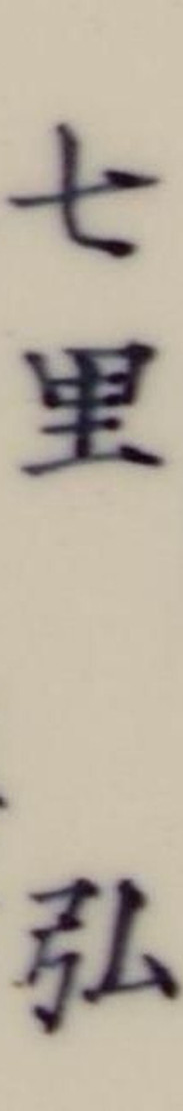七里弘
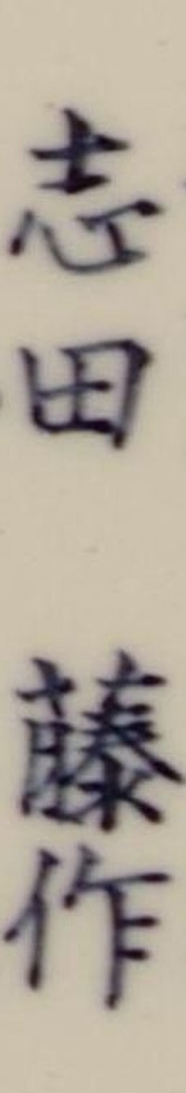志田藤作
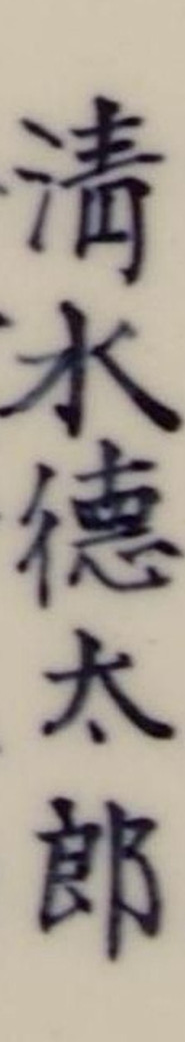清水徳太郎
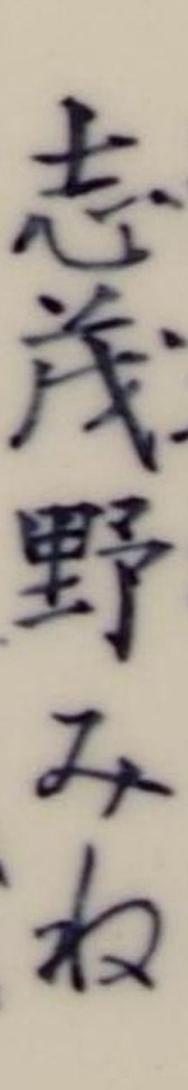志茂野みね
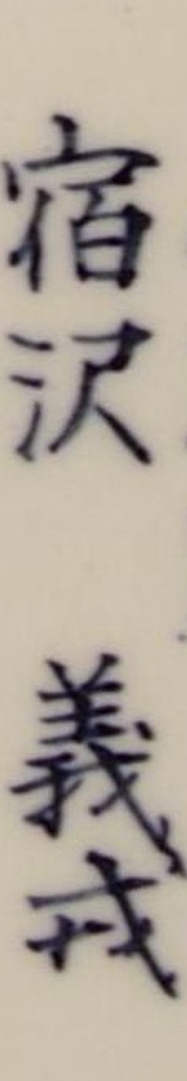宿沢義戎
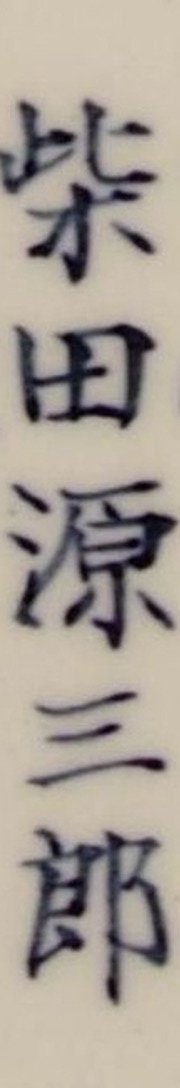柴田源三郎
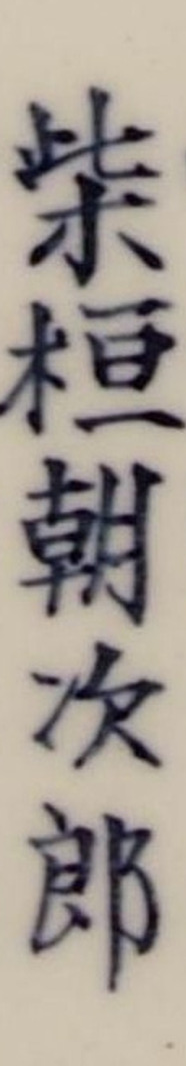柴桓朝次郎
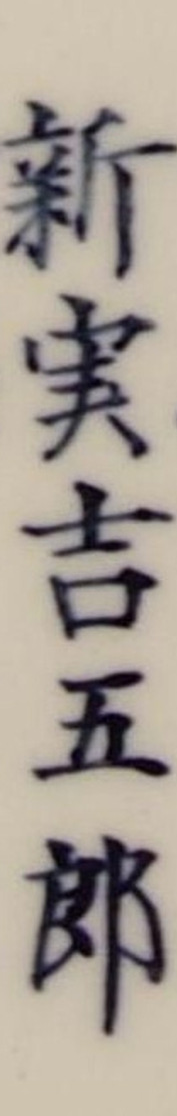新実吉五郎
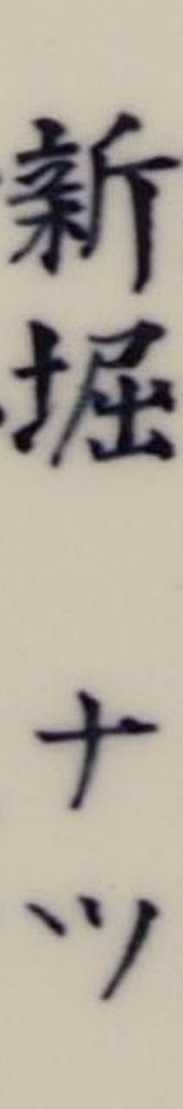新堀ナツ
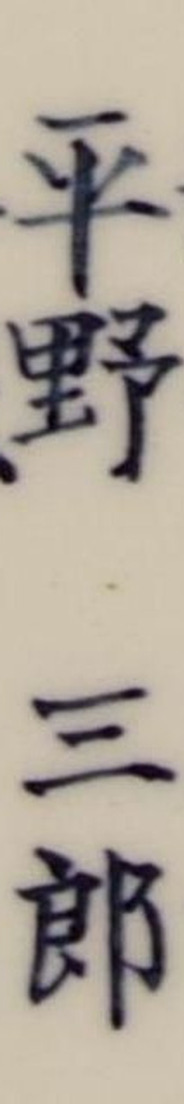平野三郎
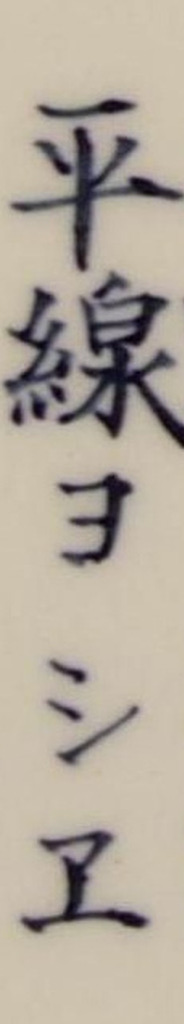平線ヨシエ
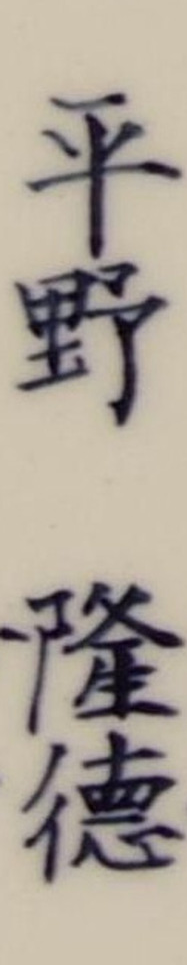平野隆徳
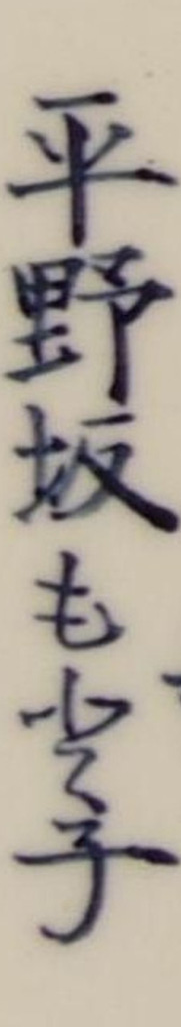平野坂もと子
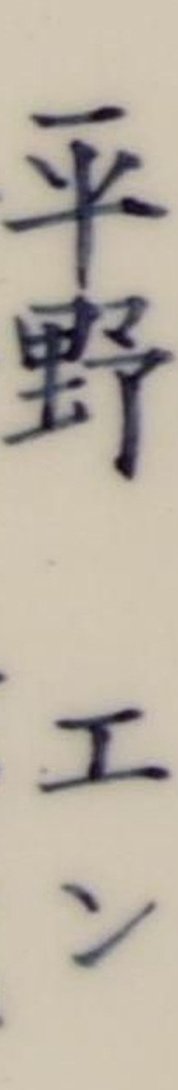平野エン
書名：E~L
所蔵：高野山金剛峯寺
